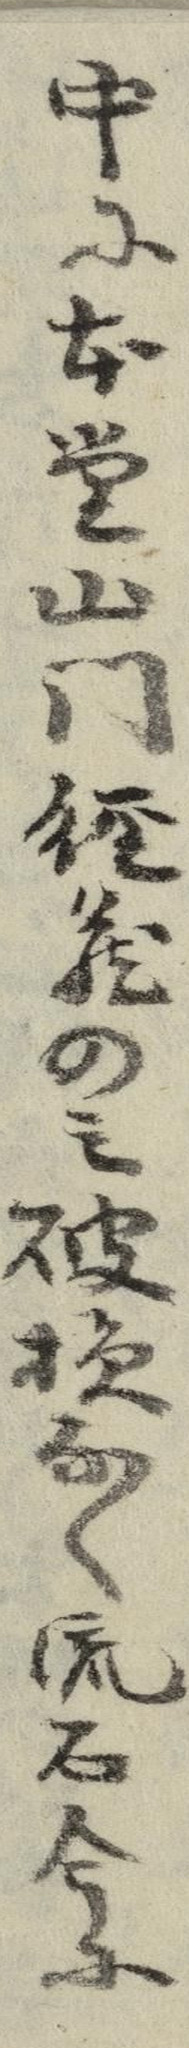中に本堂山門経蔵のミ破損なく流石今に
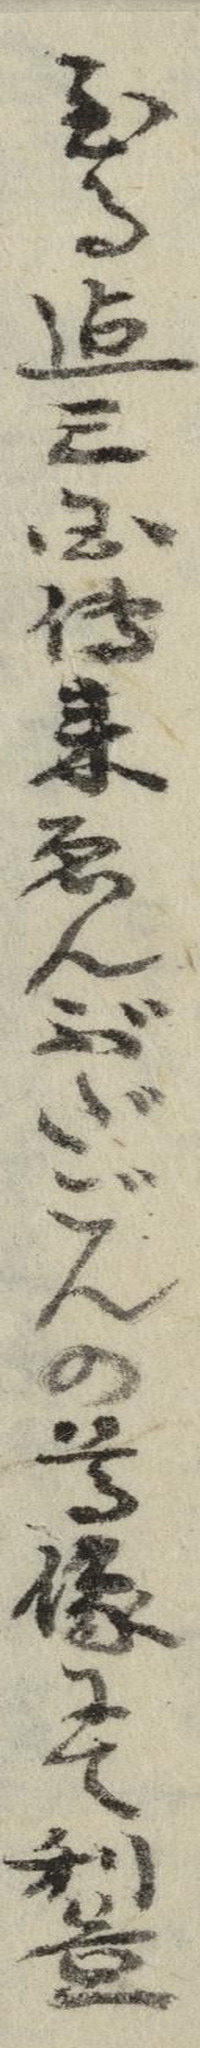至る迄三国伝来ゑんぶだごんの尊像にて利益
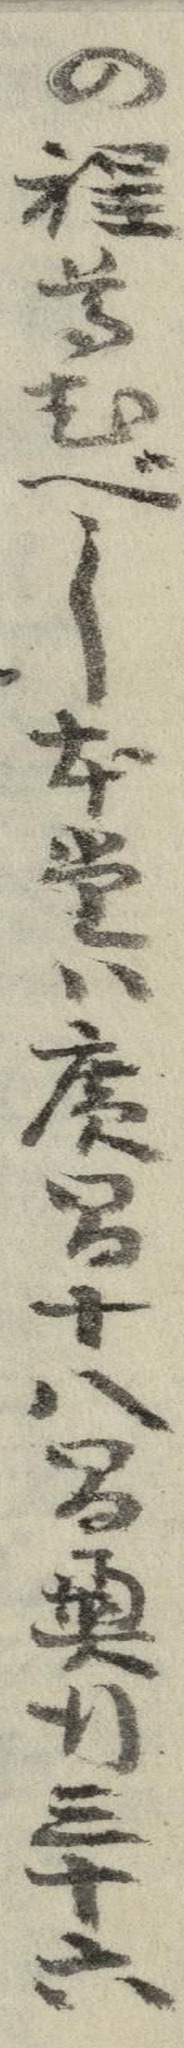の程尊むべし本堂ハ広間十八間奥行三十六
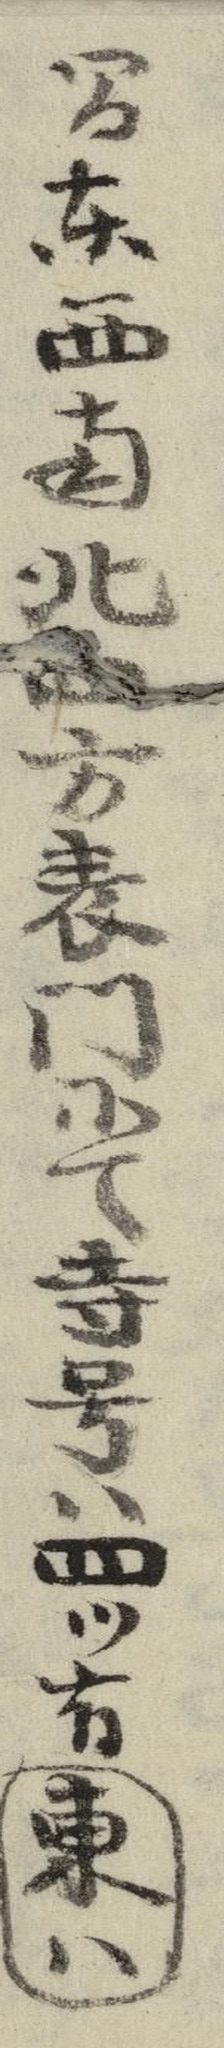間東西南北四方表門にて寺号ハ四ッ有東ハ
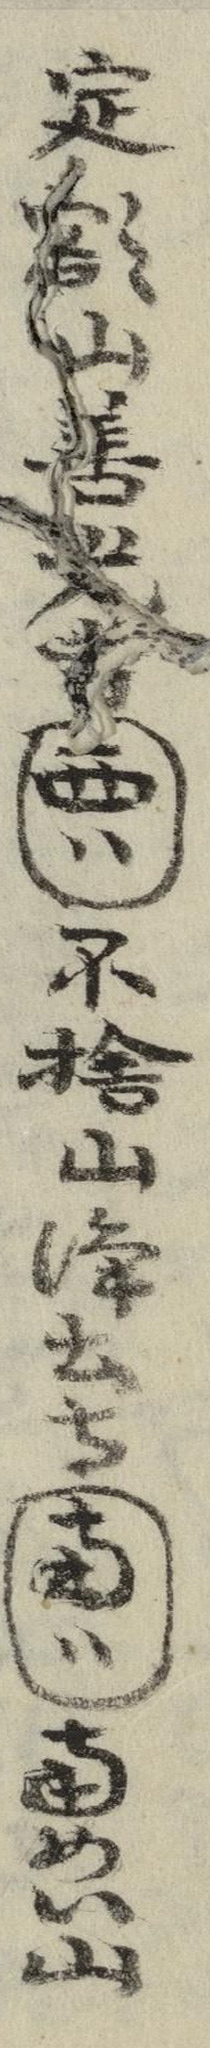定額山善光寺西ハ不捨山浄土寺南ハ当めい山
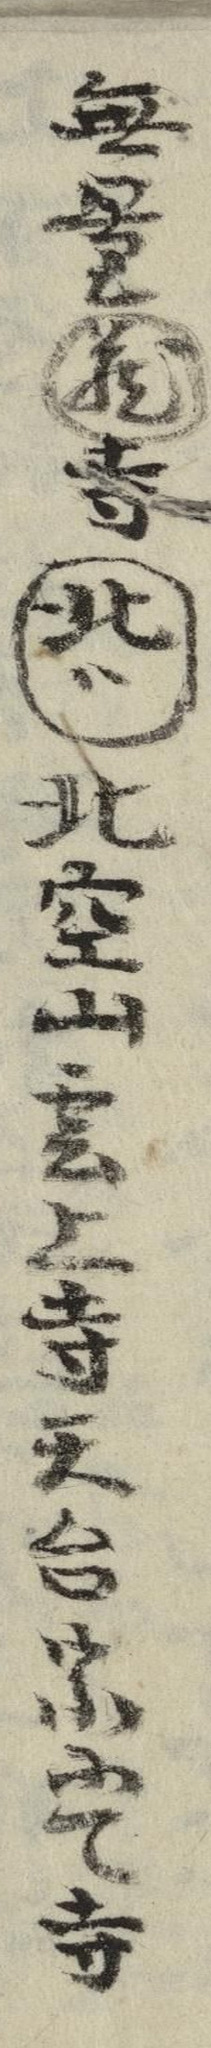無量蔵寺北ハ北空山雲上寺天台宗にて寺
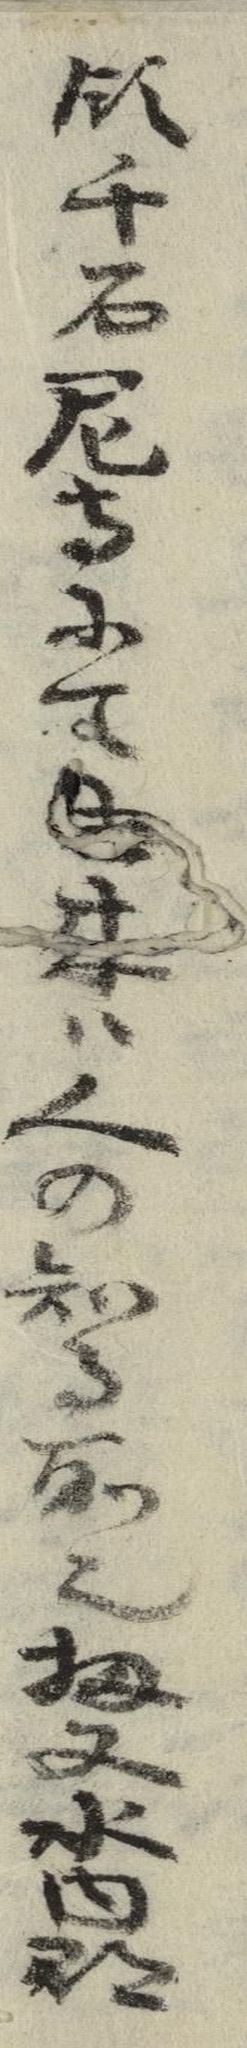領千石尼寺にて古來ハ人の知る所也扨又水内郡
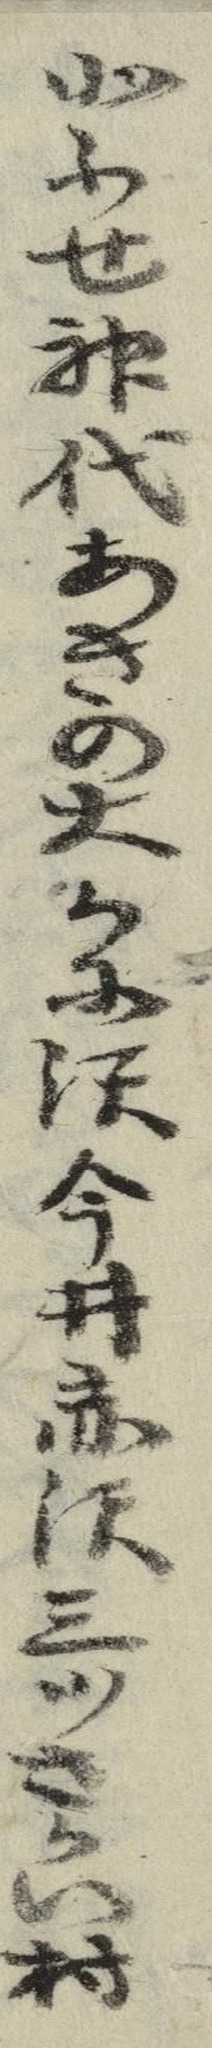北ふせ神代あさの大かに沢今井赤沢三ッさかい村
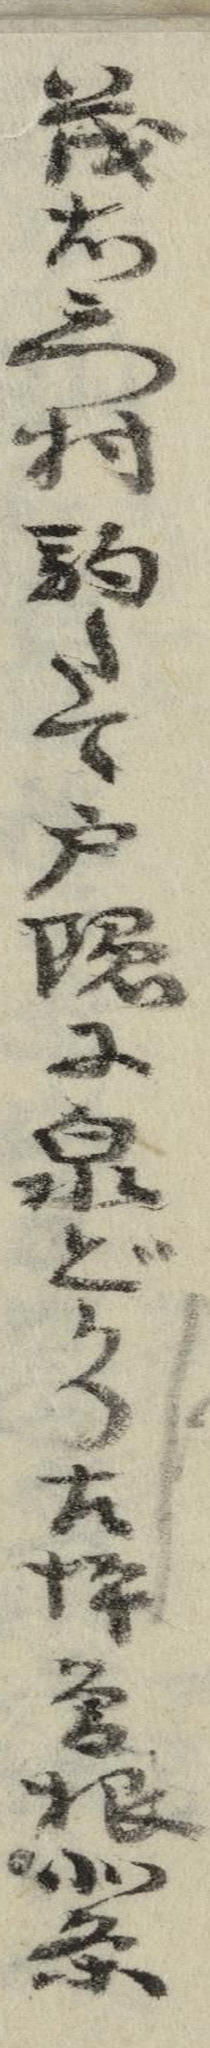茂右衛門村駒たて戸隠に泉どうり大坪曽根北条
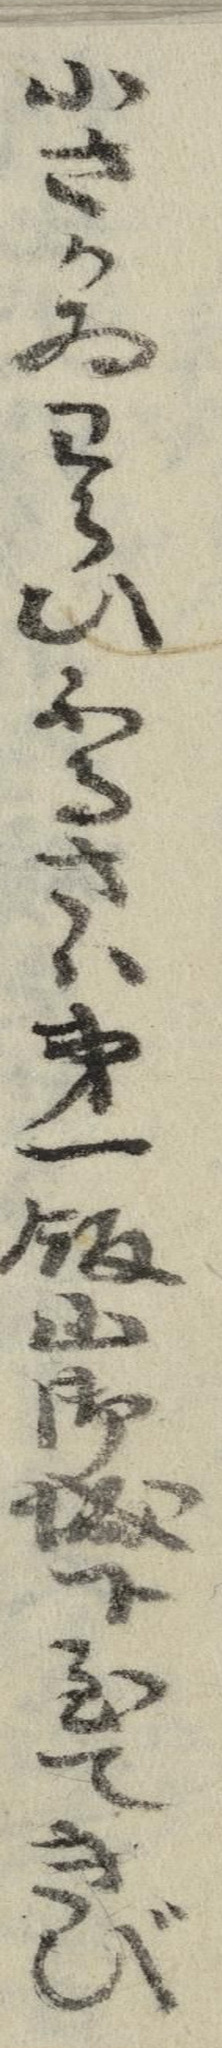小さかゐわらひふるさは第一飯山御城下至てきび
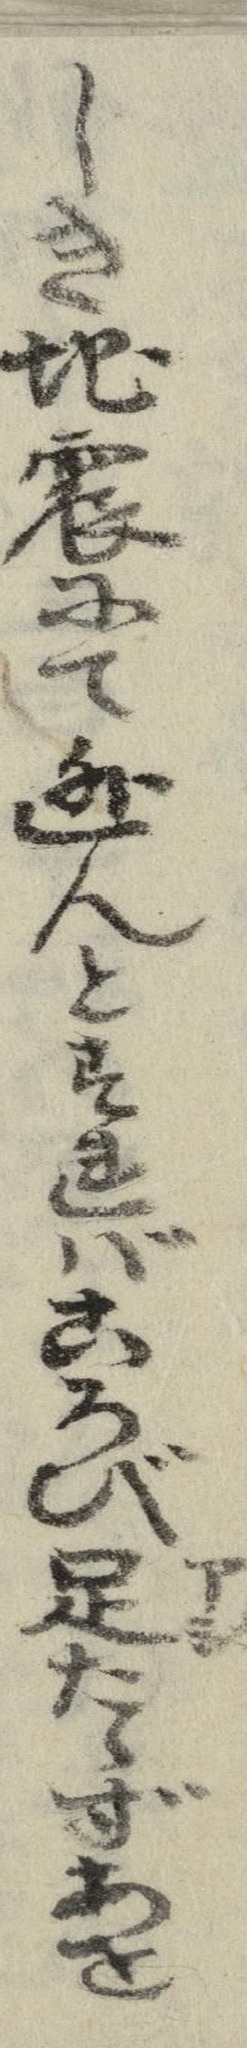しき地震にて逃んとすれバころび足たゝずあを
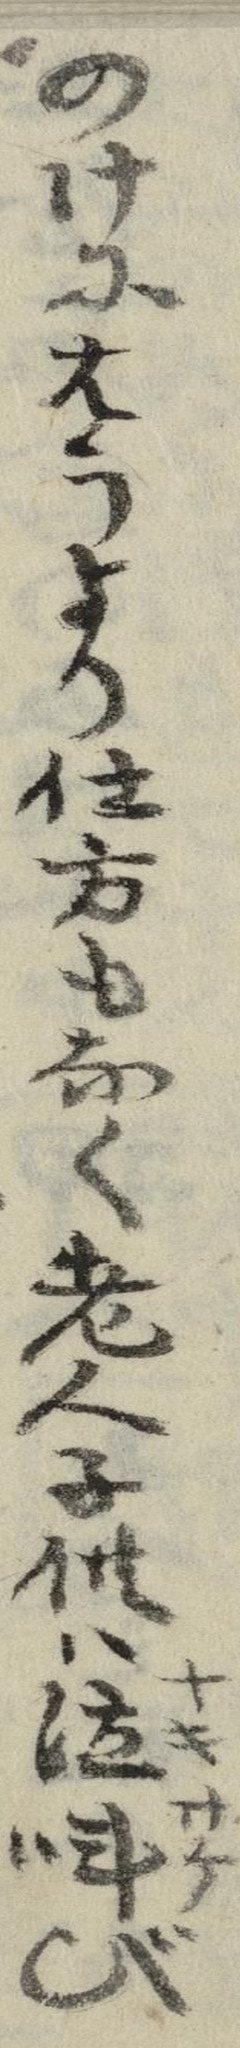のけにはうより仕方もなく老人子供ハ泣叫び
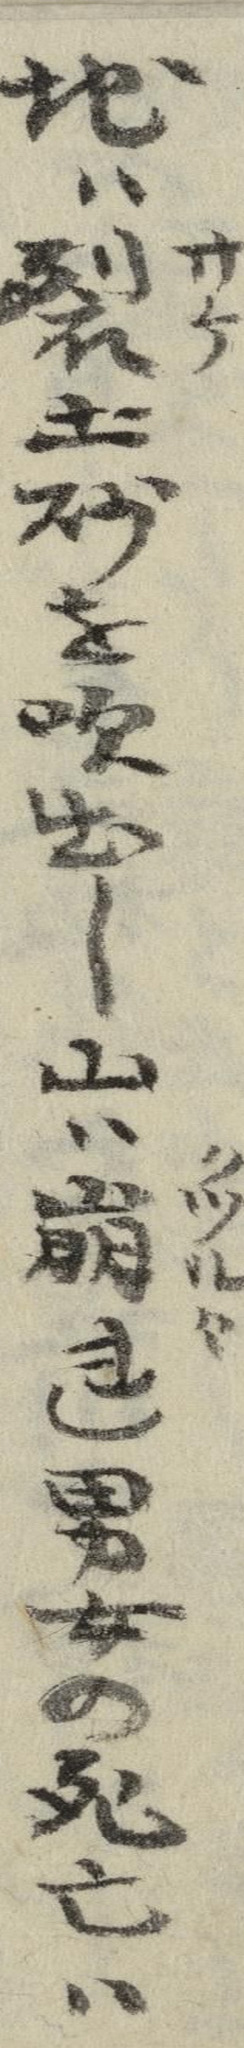地ハ裂土砂を吹出し山ハ崩れ男女の死亡ハ
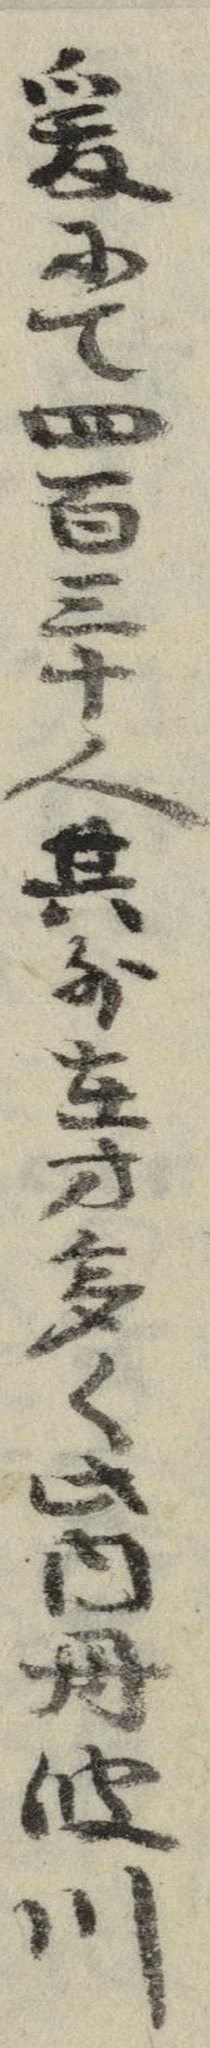爰にて四百三十其外在方多く此内丹波川
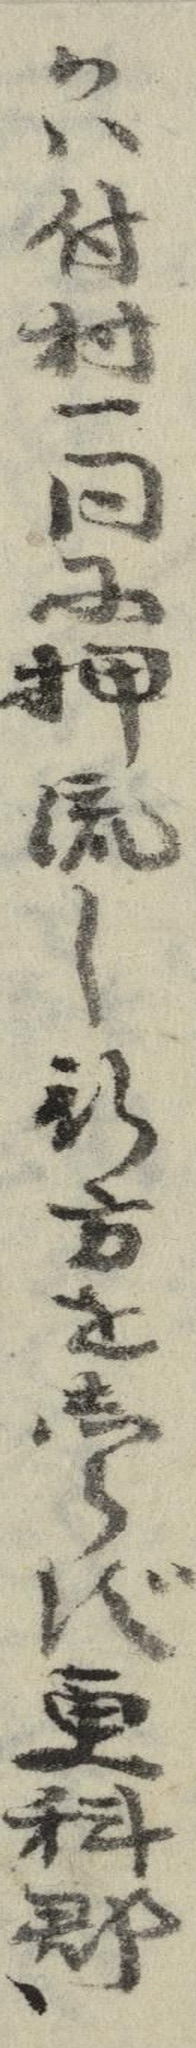かハ付村一同に押流し行方をしらず更科郡ハ
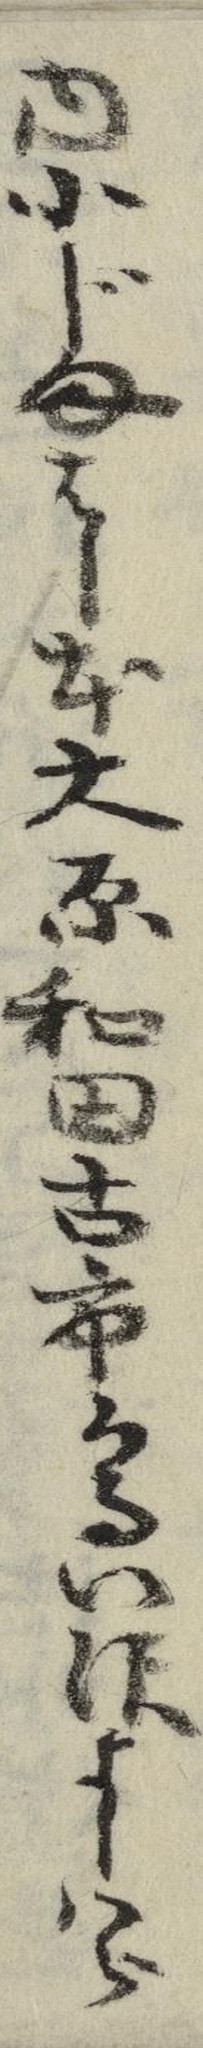内小じまはし本大原和田古市かるい沢よしハら
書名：信州大地震一件之冩　丁未弘化四年三月吉日
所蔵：東京大学地震研究所図書室 Earthquake Research Institute Library, The University of Tokyo, JAPAN
